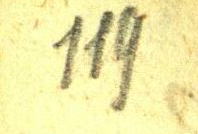119
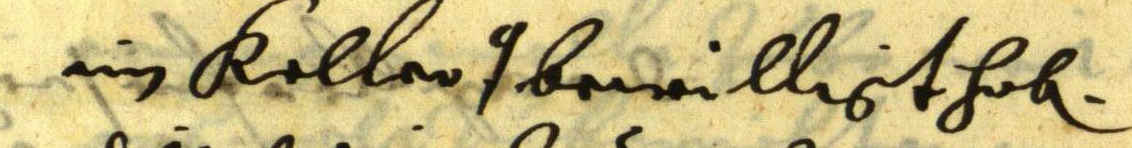im Keller bewilligt hab.
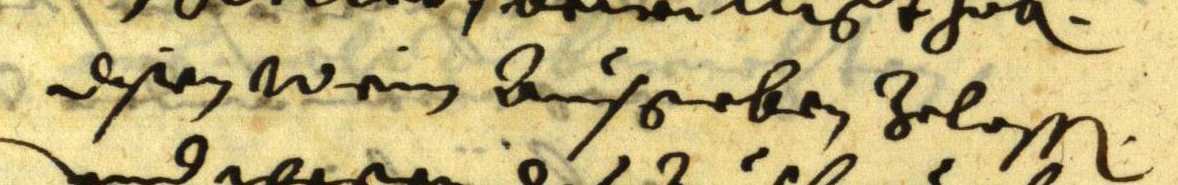disen Wein Aūsgeben Zelass.
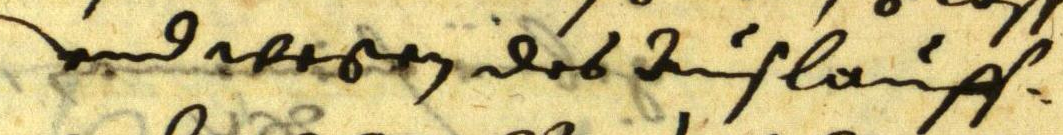Vnd wegen des Aūslaūff¬
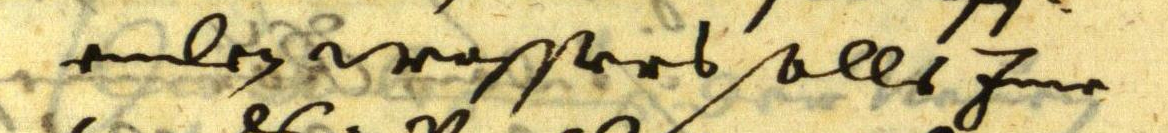enden Wassers solls Ime
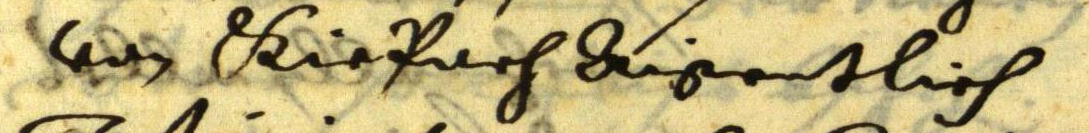von KiePach Aigentlich
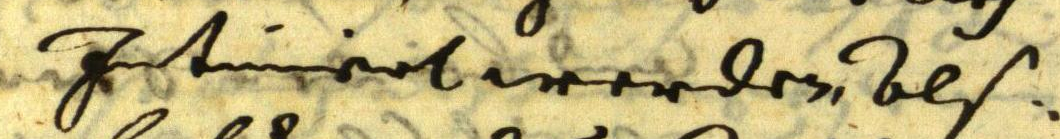Intimiert werden, Als¬
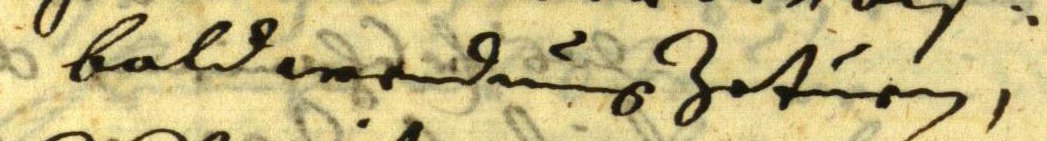bald wendūng Zetūen,
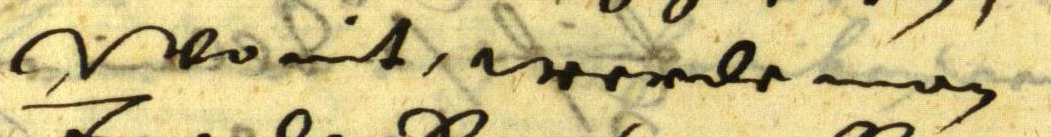Wo nit, werde man
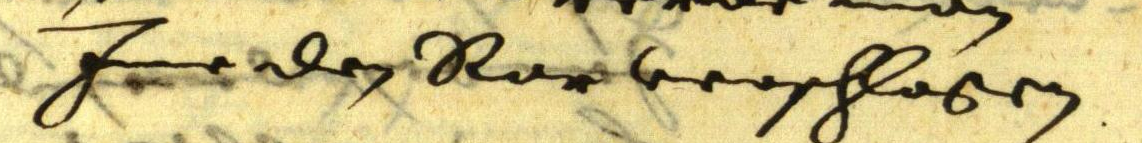Ime den Ror verschlagen.
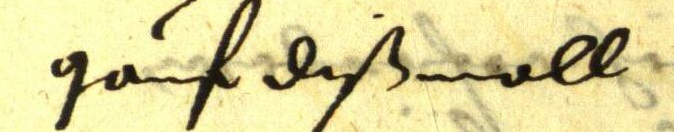aūf dißmall
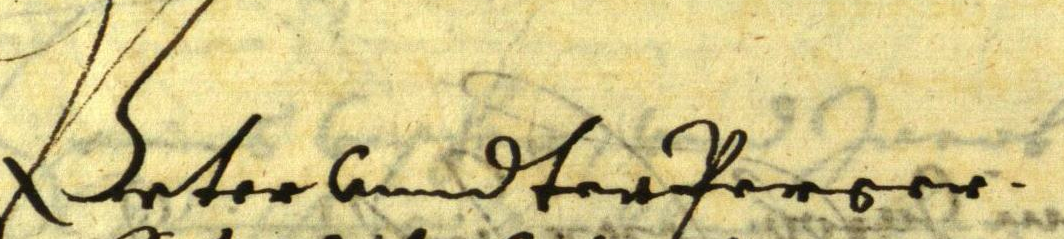Peter VnndterPerger
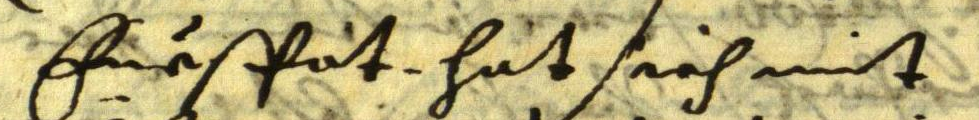FūesPot. hat sich mit
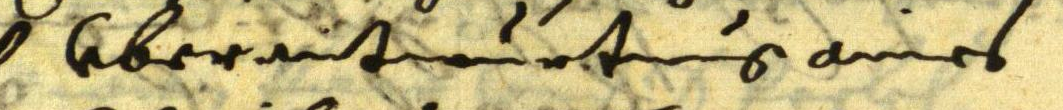v̈berantwūrtūng aines
